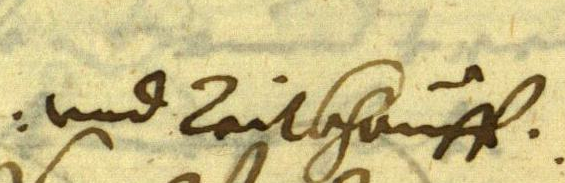:vnd Leitkhaūff:
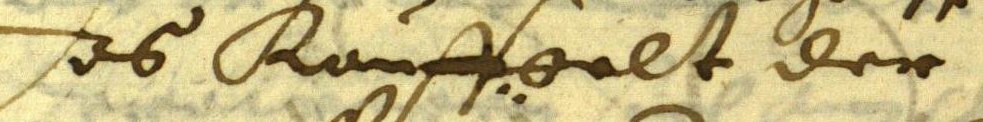Das Kaūff:gelt der
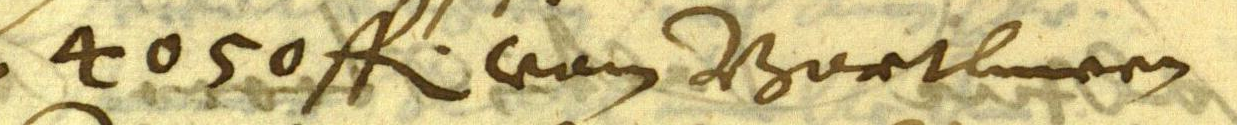4050 fl. vom Bartlmeen
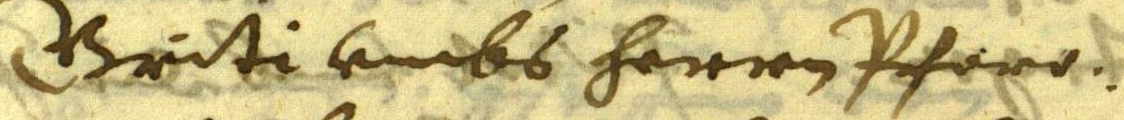Griti vmbs herrn Pfarr¬
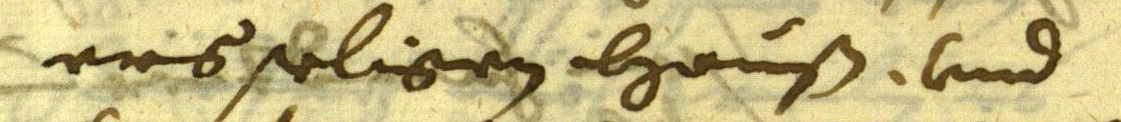ers seligen Haūß. vnd
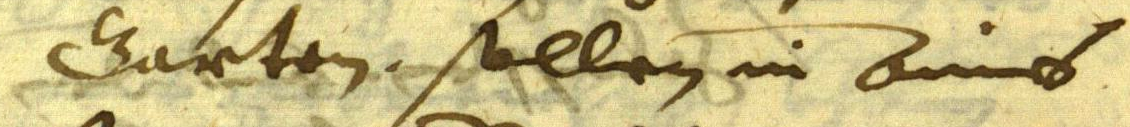Garten. sollen in Aines
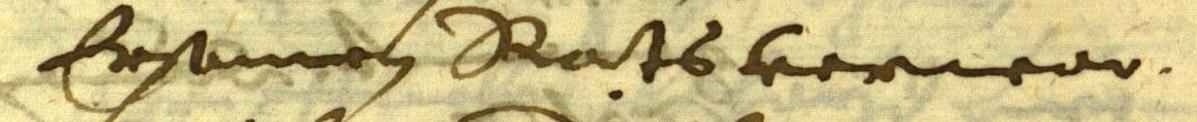Ersamen Rats verwar.
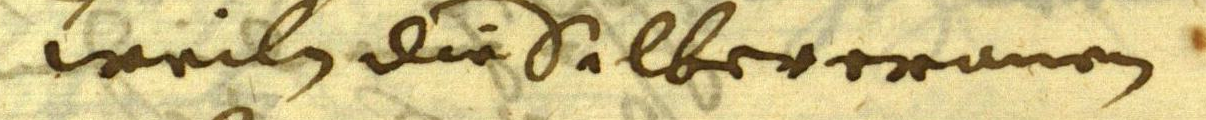Weiln die Silbercronen
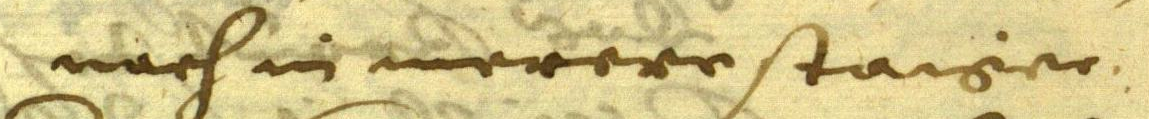noch in merere staiger¬
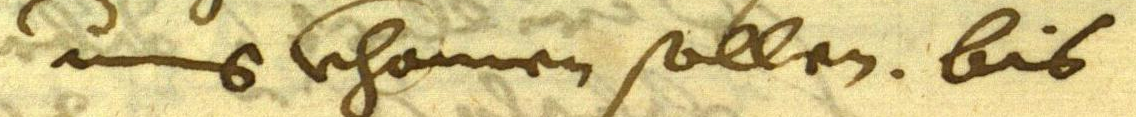ūng khomen sollen. bis
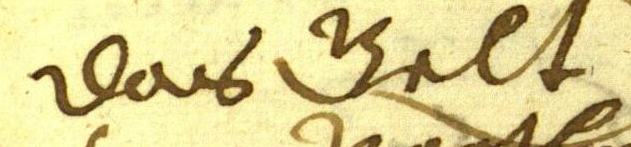Das Gelt
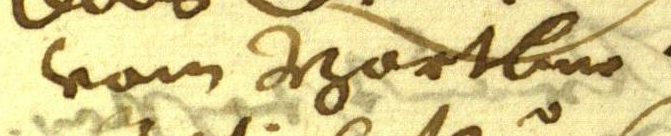vom Bartlme
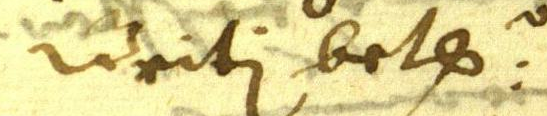Gritj bet:
